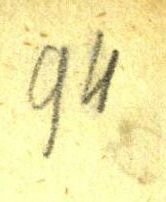94
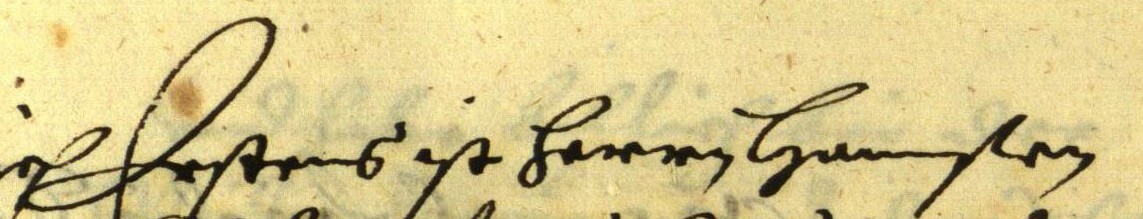Erstens ist herrn Hannsen
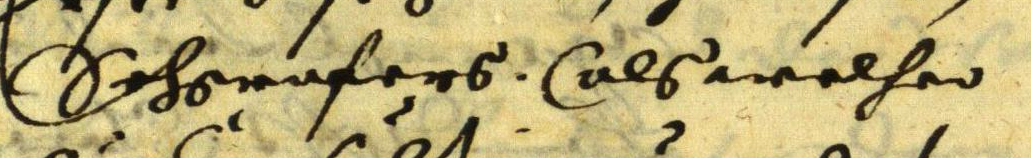Schgrafers. (als welcher
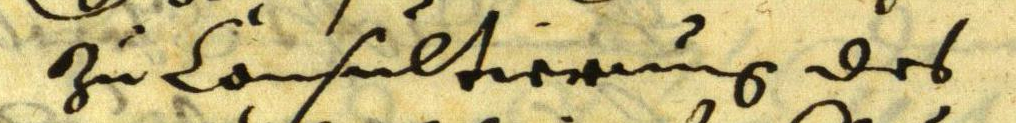Zū Consūltierūng des
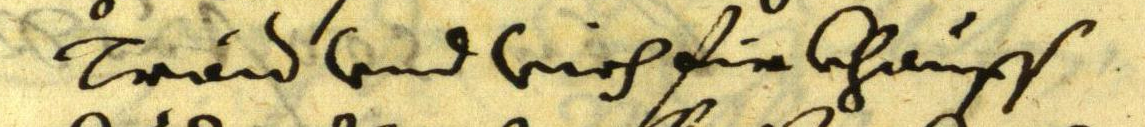Traid vnd Vieh firkhaūfs
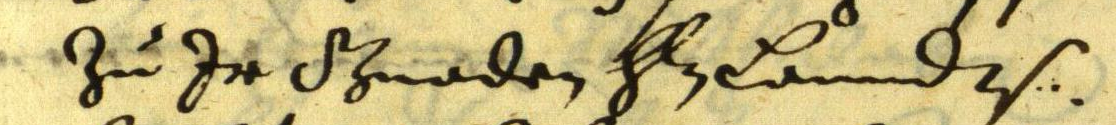Zū Ir Gnaden hln Lanndts¬
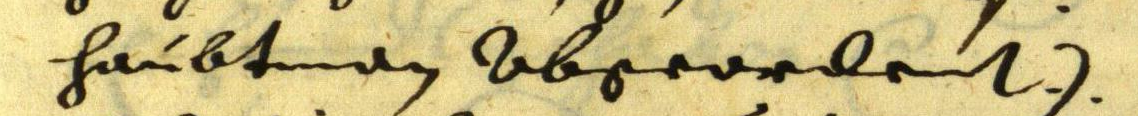haūbtman Abgeordent.).
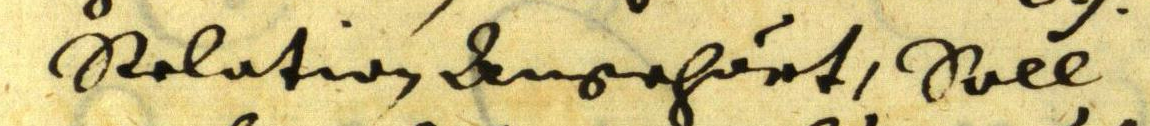Relation Angehōrt, Soll
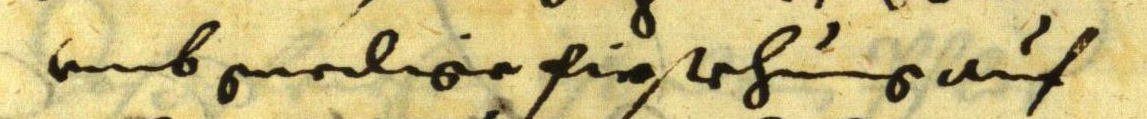vmb gnedige firsehūng aūf
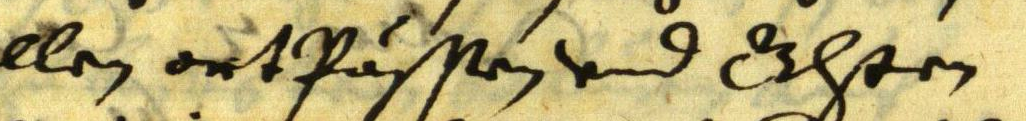allen ort Pāssen vnd Ghten
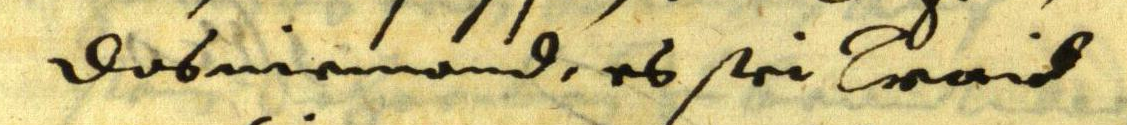das niemand, es sei Traid
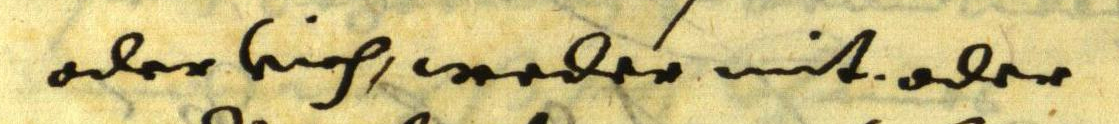oder Vieh, weder mit oder
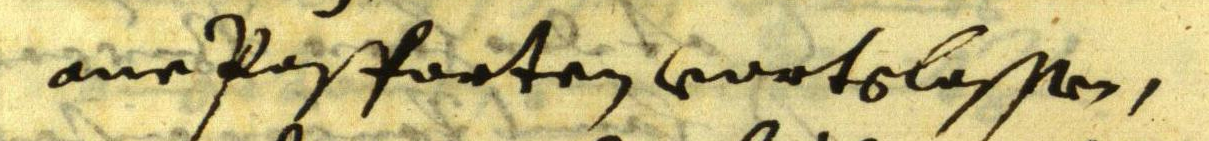one PasPorten vortglassen,
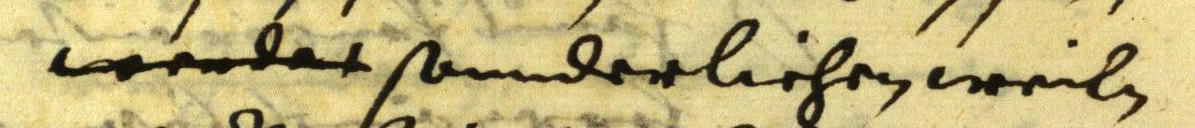werde, sonnderlichen weiln
